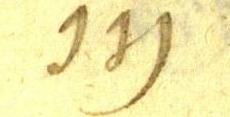111
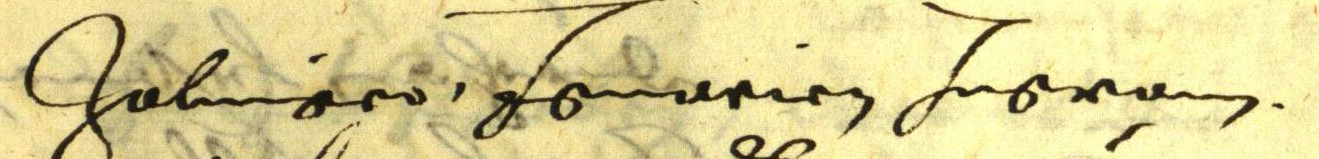Zalinger, Ignacien Ingram.
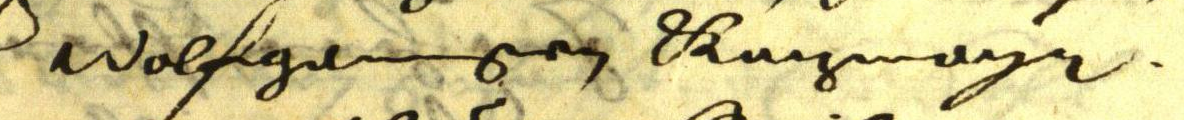Wolfganngen Kazmayr.
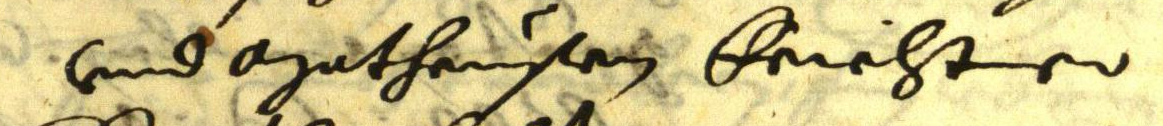vnd Matheūsen Feichtner
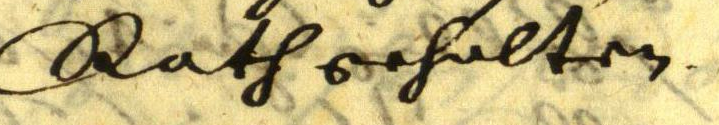Rath gehalten.
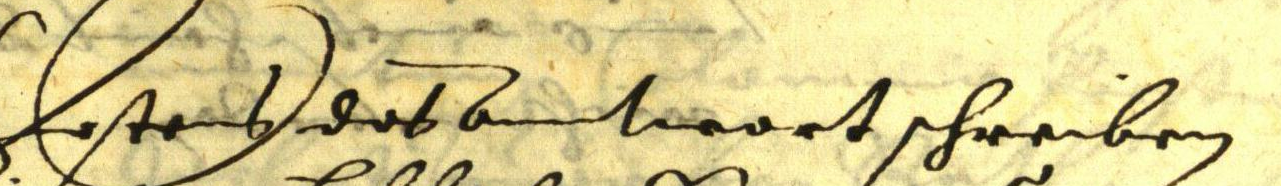Erstens das Anntwort schreiben
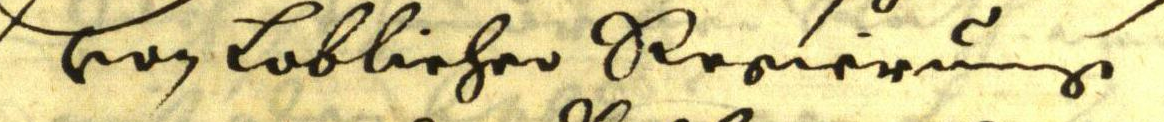von Loblicher Regierūng
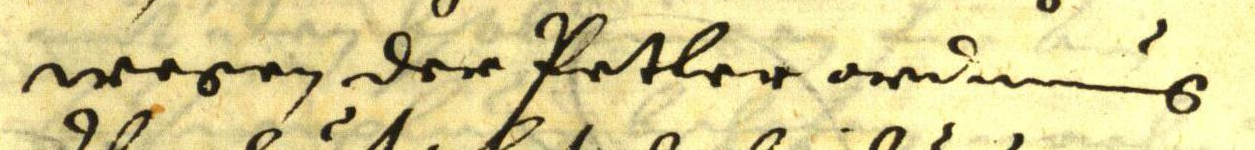wegen der Petler ordnūng
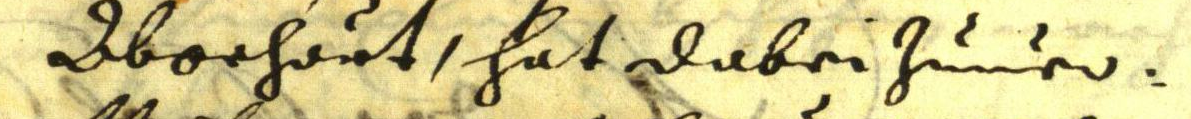Abgehōrt, hat dabei Zūūer¬
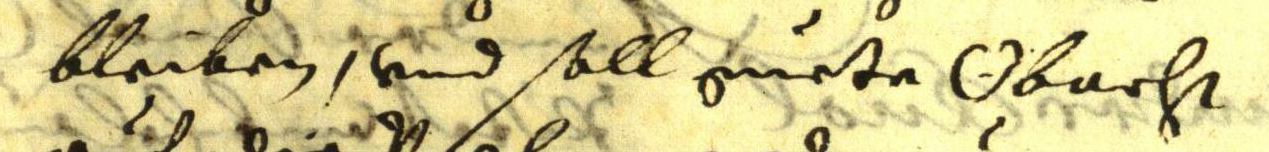bleiben, vnd soll gūete Obacht
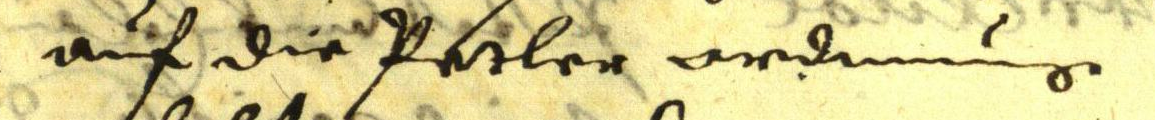aūf die Petler ordnūng
